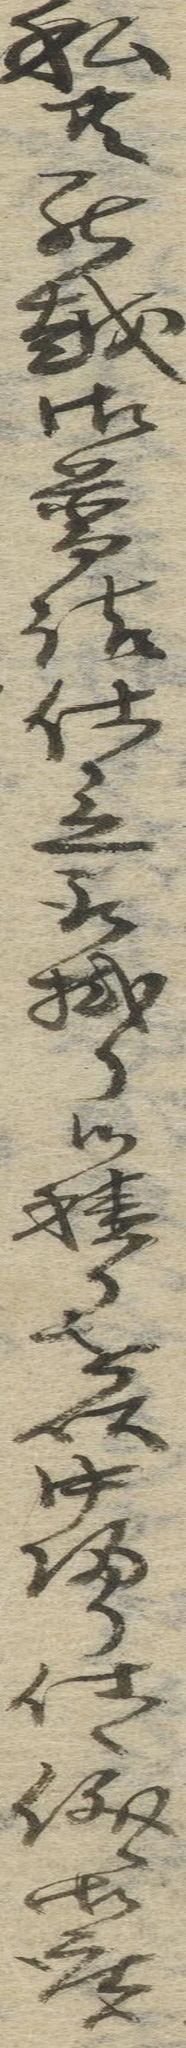私共罷越御普請仕立取掛り候積りを以中帰り仕候儀二御座候
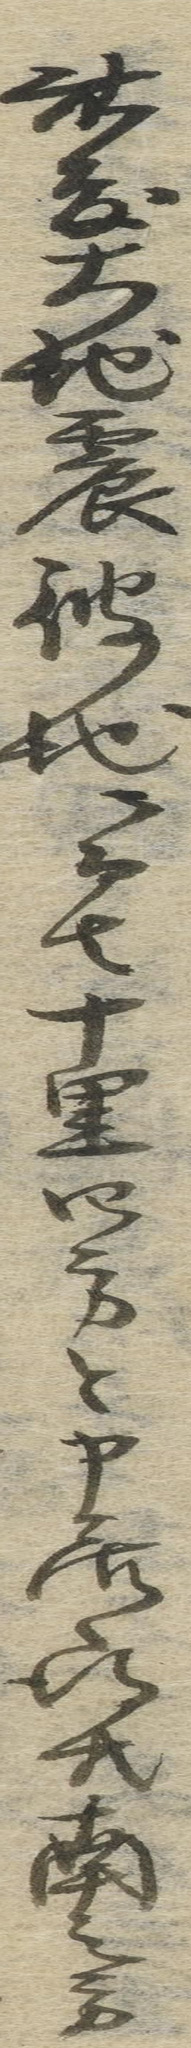一此度大地震彼地二而は十里四方と申居候得共南之方
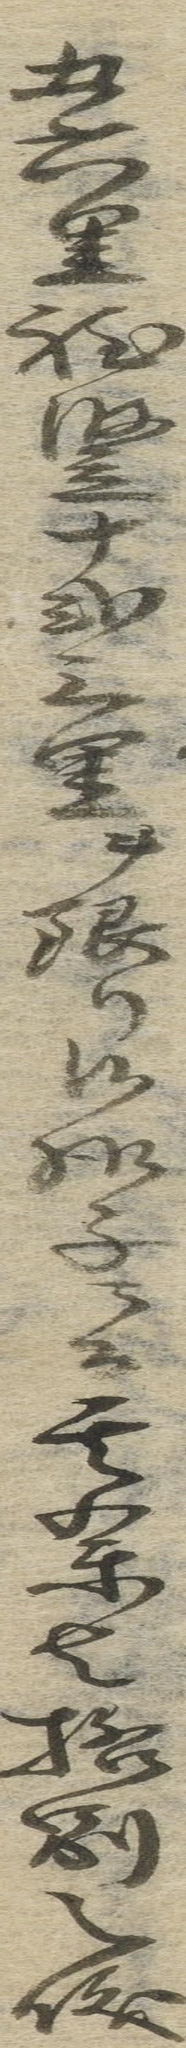五六里程竪三十弐三里ヲ限り候様子二而其余ハ格別之儀
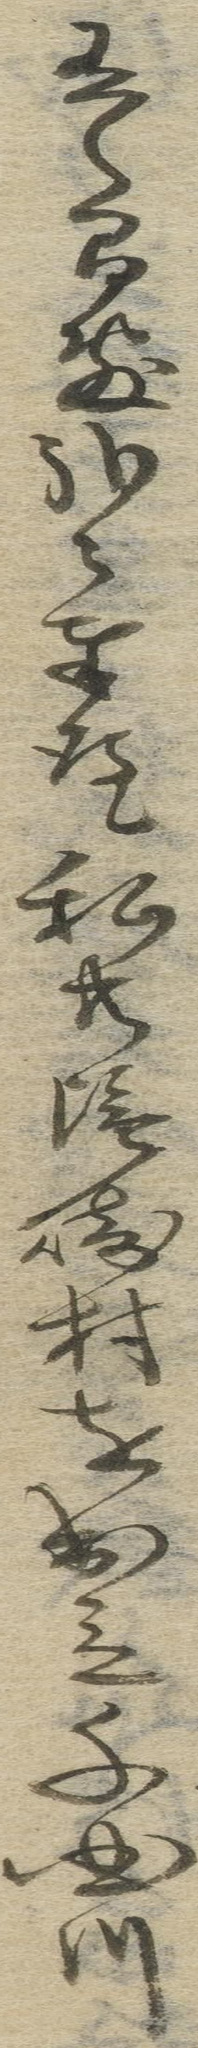有之間敷哉と奉存候私共塩崎村を出立千曲川

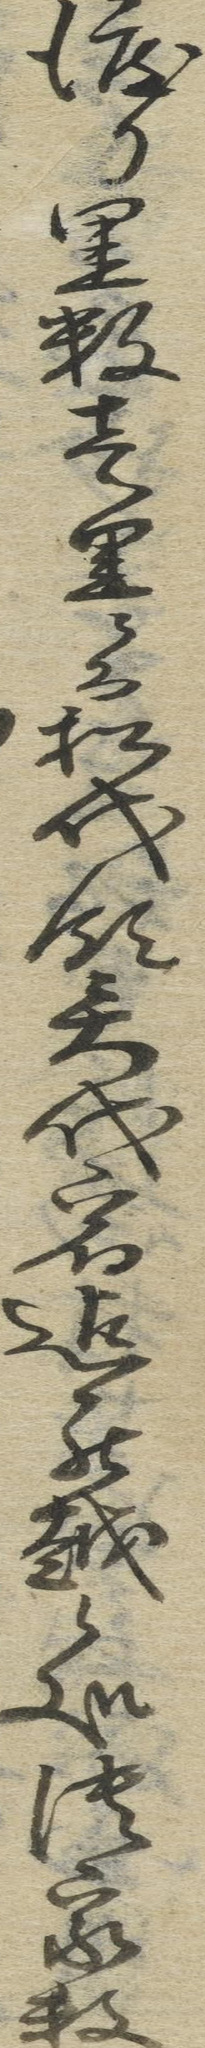渡り里数壱里二而松代領矢代宿迄罷越候処潰家数
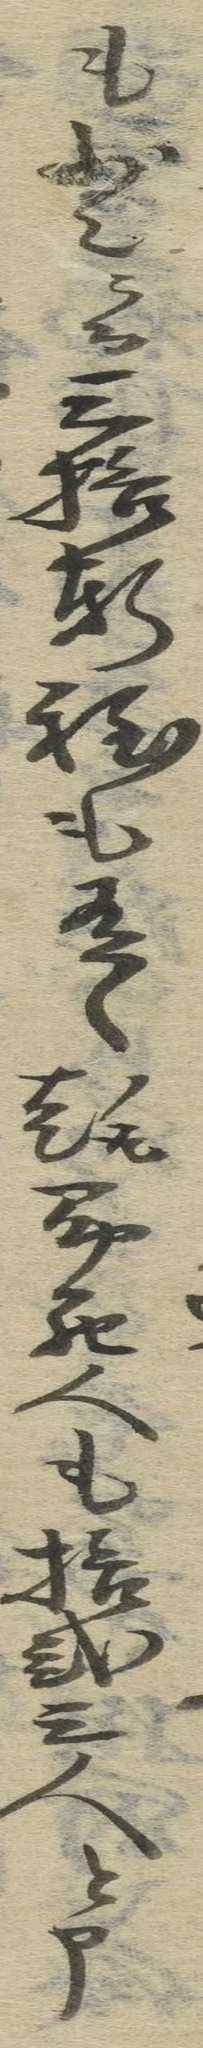も少々二而三拾軒程も有之趣即死人も拾弐三人と申
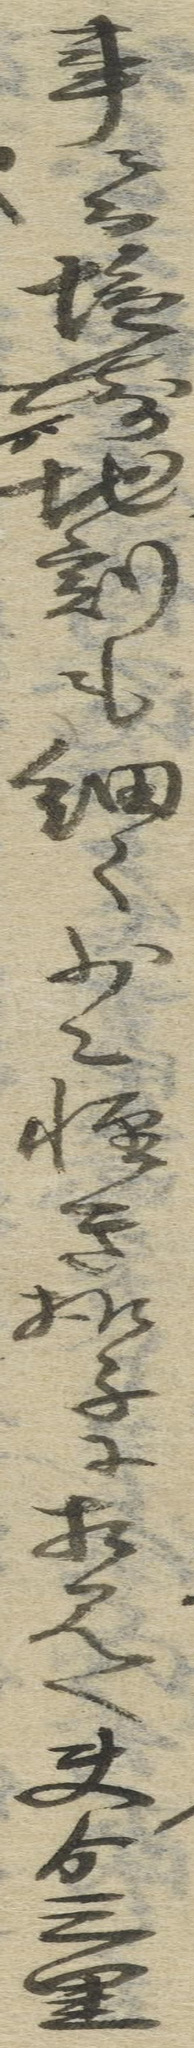事二而塩崎地割も細く少々軽き様子に相見へ夫ゟ三里
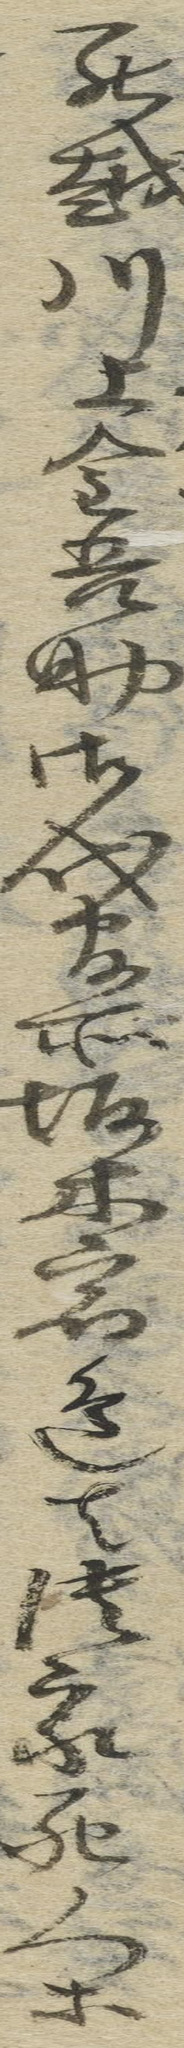罷越川上金吾助御代官所坂木宿辺は潰家死人等
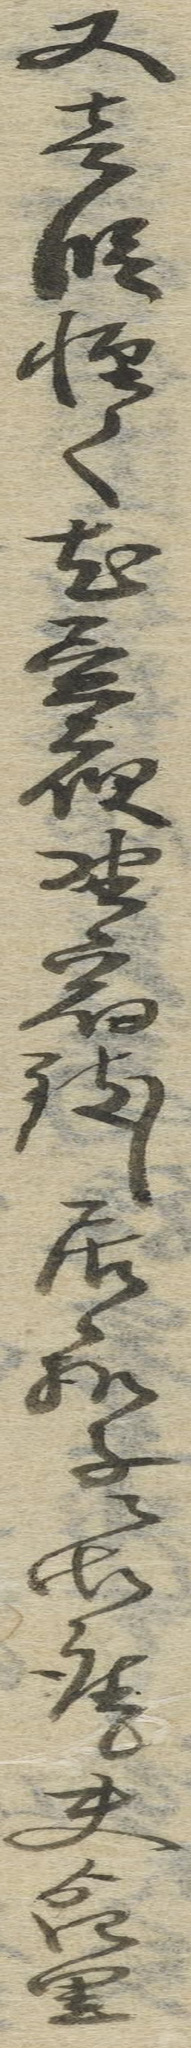又壱段軽く尤昼夜野宿致候様子二御座候夫ゟ四里
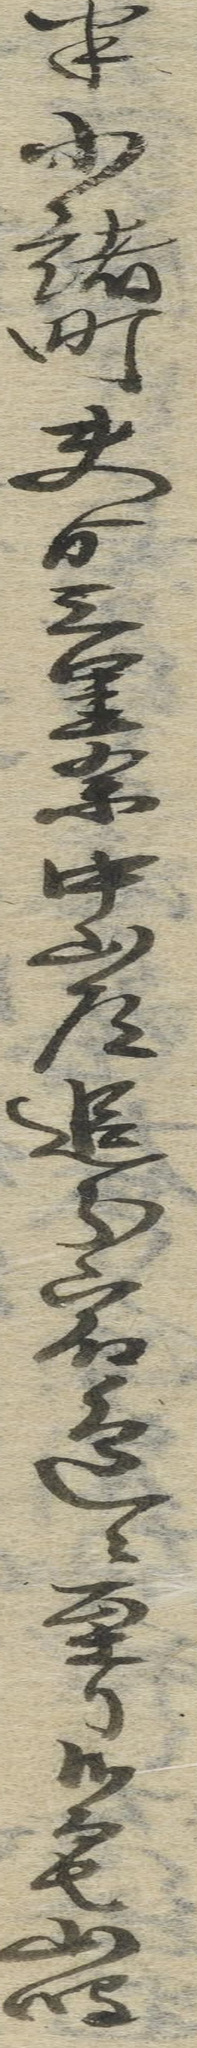半小諸町夫ゟ三里余中山道追分宿辺二至り候而は山鳴
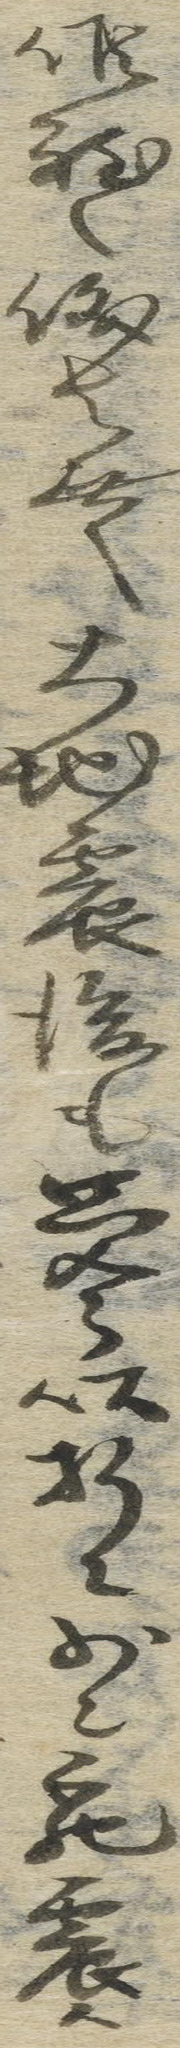候程之儀は無之大地震後も只今以折々少々宛震候
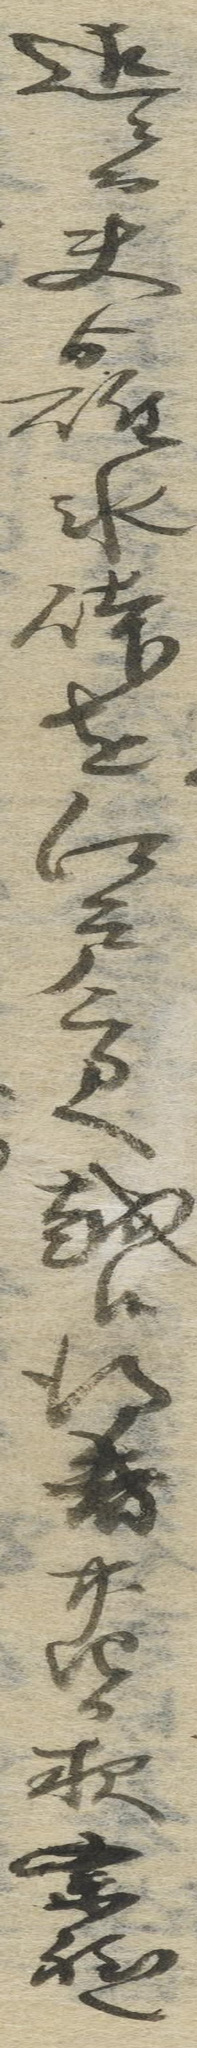迄二而夫ゟ碓氷峠を江戸方へ越候得は廿四日夜余程之
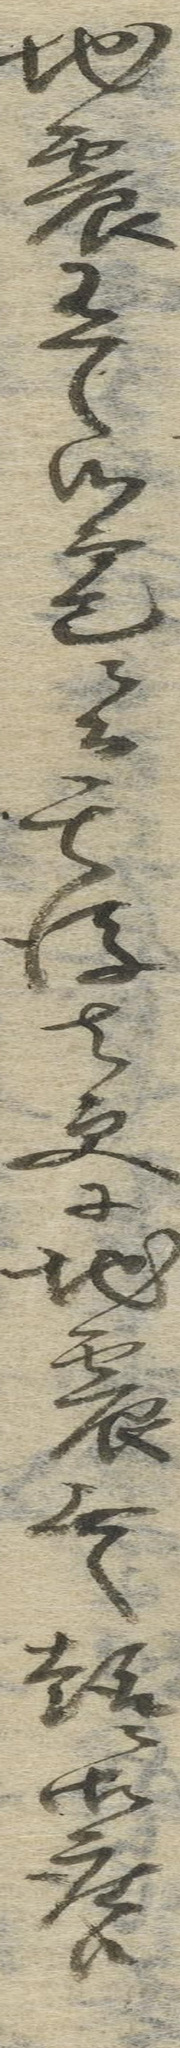地震有之候而巳二而其後は更に地震無之趣二御座候
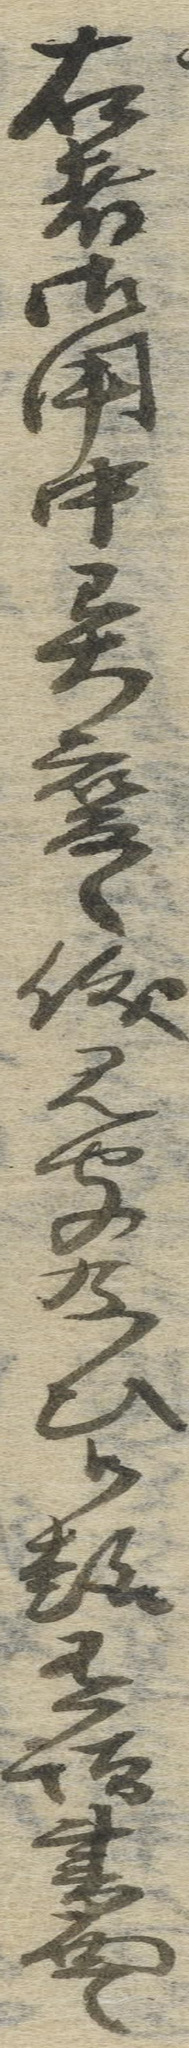右は御用中異変之儀及見聞及ひ候趣有増書面之
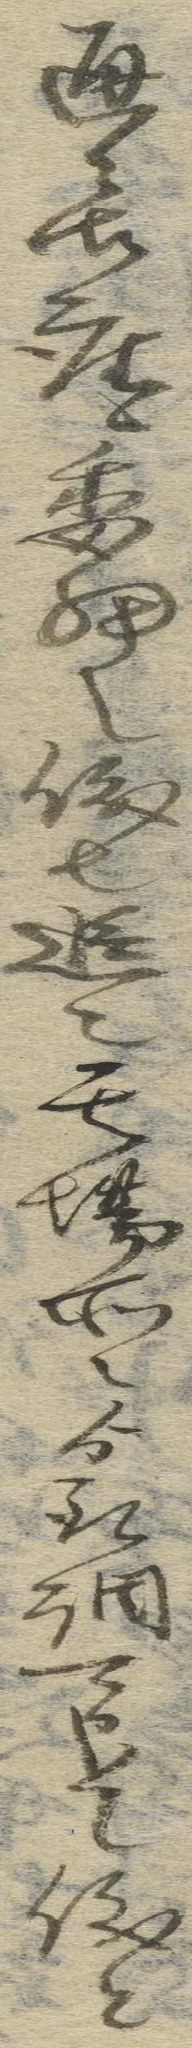通二御座候委細之儀は追々其場所〳〵ゟ取調申上候儀二
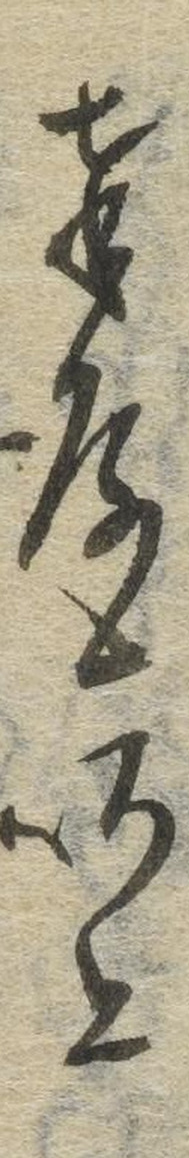奉存候以上
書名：信濃越後　地震書留
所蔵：東京大学地震研究所図書室 Earthquake Research Institute Library, The University of Tokyo, JAPAN
